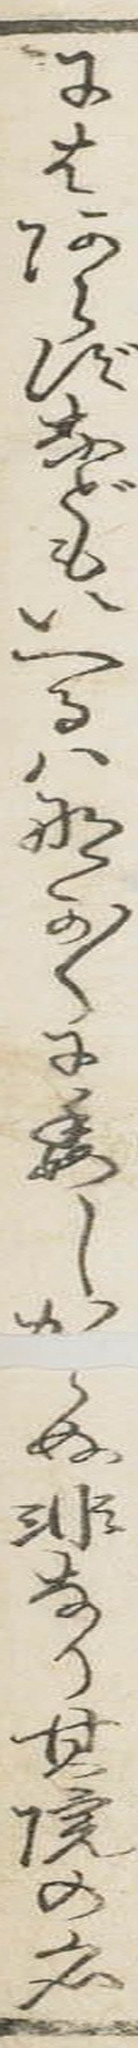にはあらずなどもいへるはなか〳〵に委しからぬ非なり其院の名
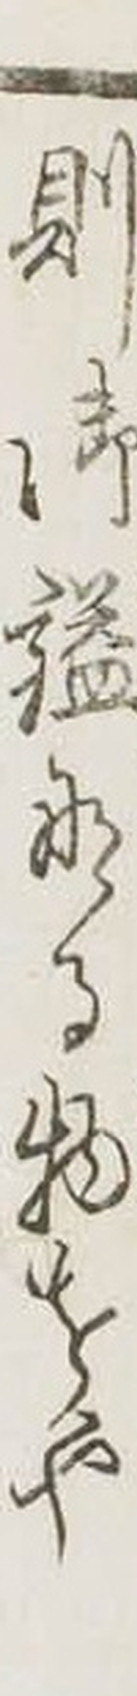則御謚なる物をや
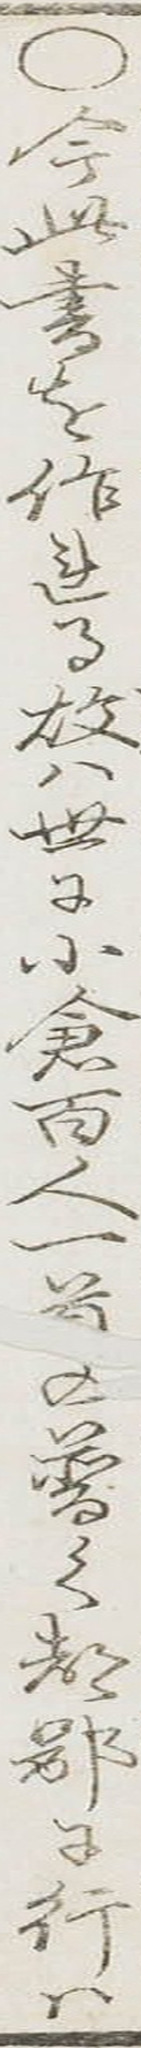○今此書を作れる故は世に小倉百人一首の普く都鄙に行は
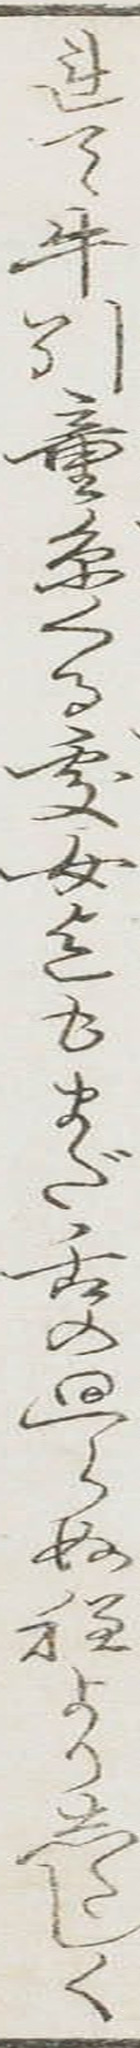れて牛引童糸くる処女迄もまだ舌の廻らぬ程よりしたしく
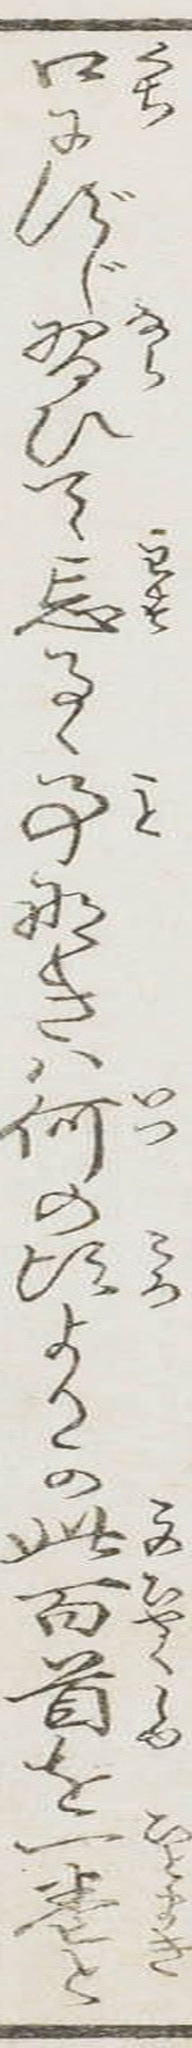口にずじ習ひて忘るゝ事なきは何の頃よりか此百首を一巻と
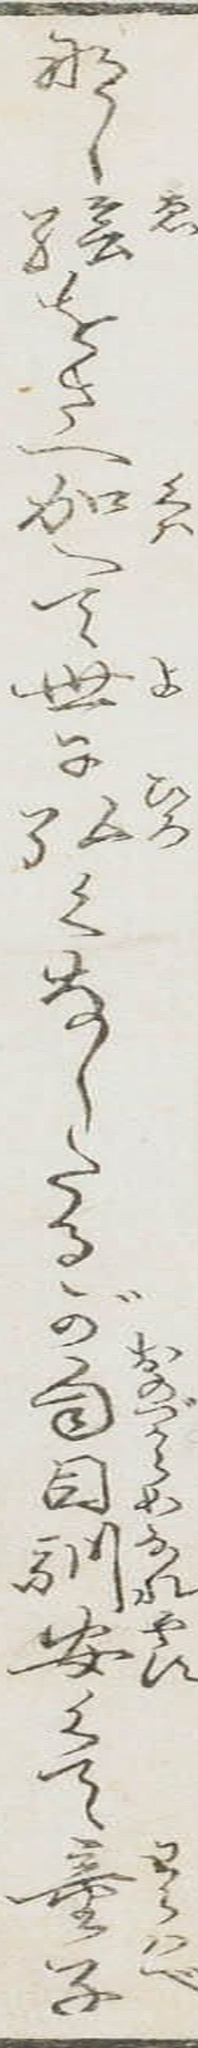なし絵をさへ加へて世に弘くなしたるが自目馴安くて童子
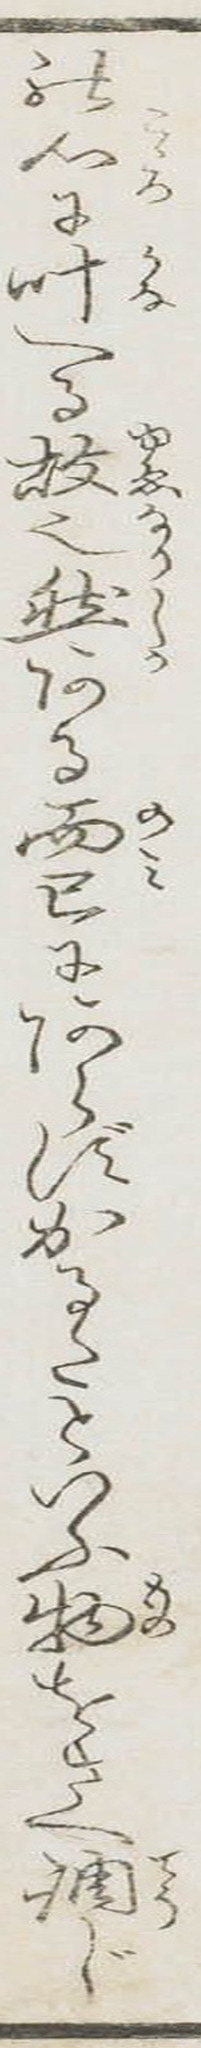の心に叶へる故也然ある而已にあらずかるたといふ物をさへ調じ
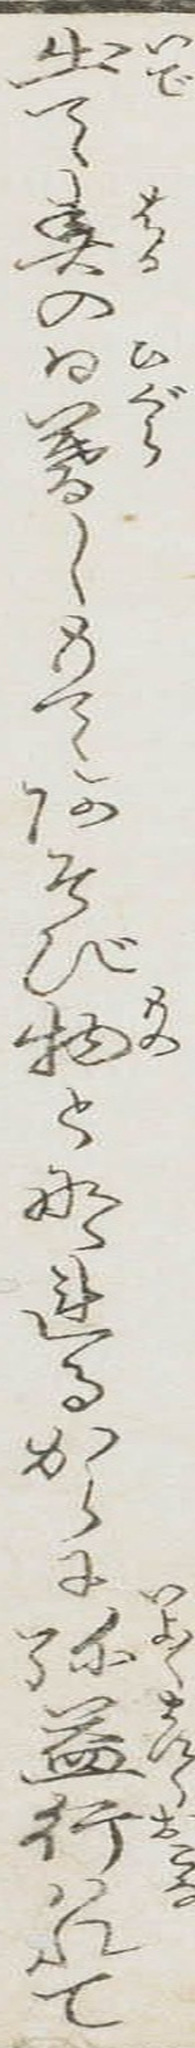出て春の日暮しもてあそび物となれるからに弥益行はれて
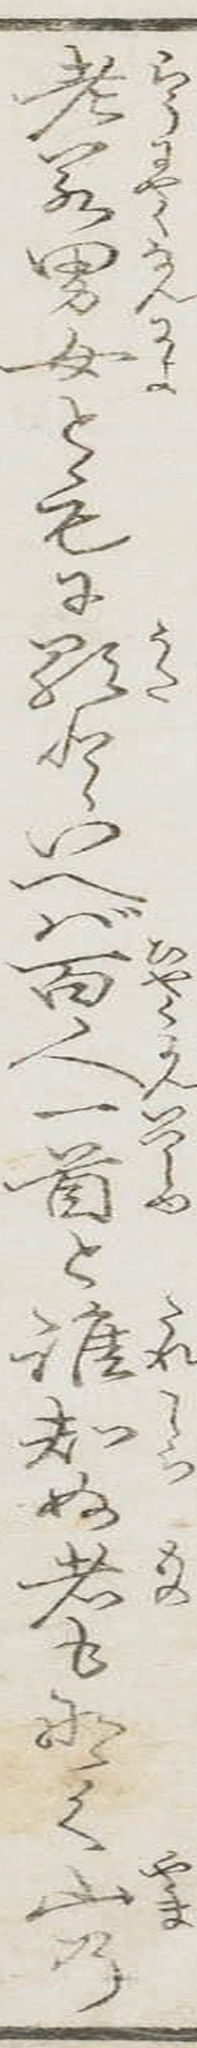老若男女ともに歌といへば百人一首と誰知ぬ者もなく山の
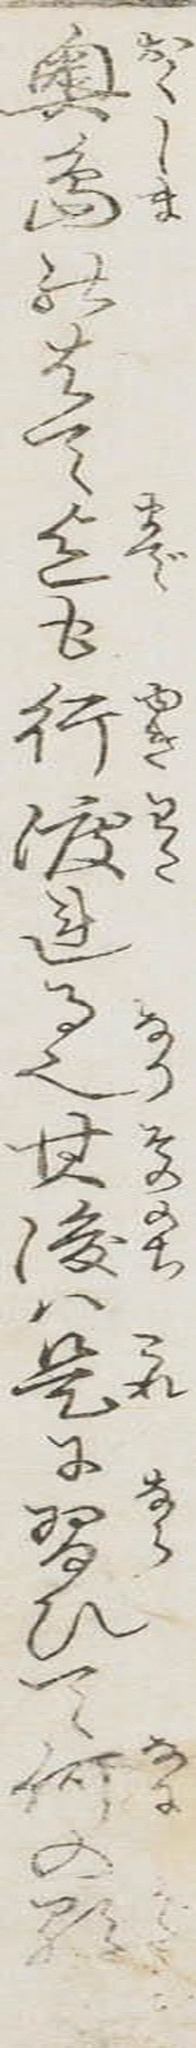奥島のはて迄も行渡れる也其後は是に習ひて何の歌がる
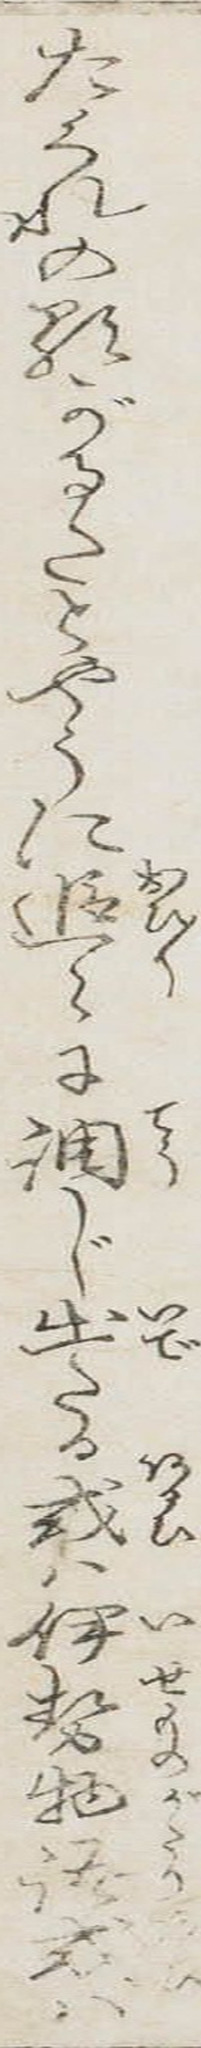たくれの歌がるたとやうに追々に調じ出たる或は伊勢物語或は
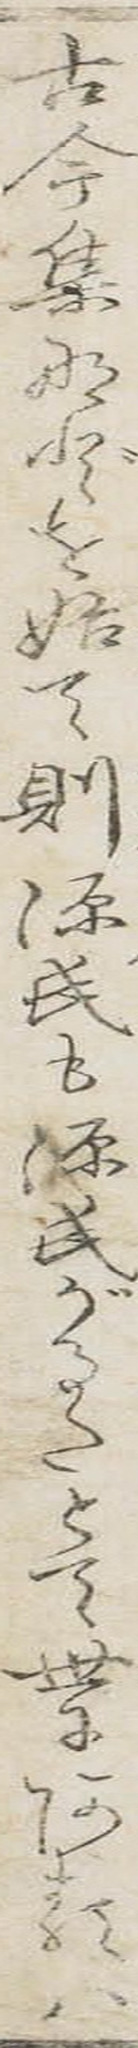古今集などを始て則源氏も源氏がるたとて世にあるは

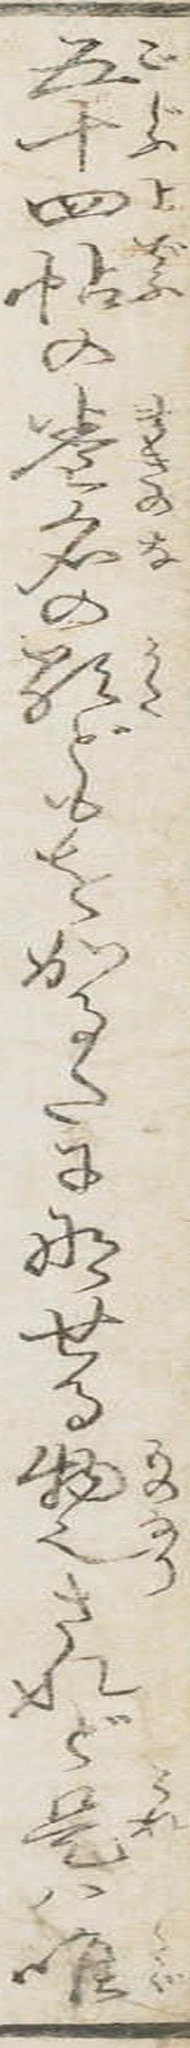五十四帖の巻名の歌どもをかるたになせる物也されど是は唯
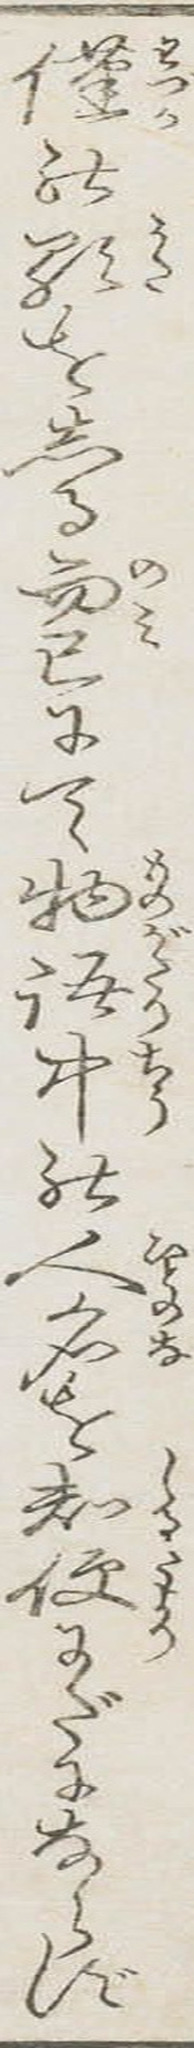僅の歌をしる而已にて物語中の人名を知便にだにならず
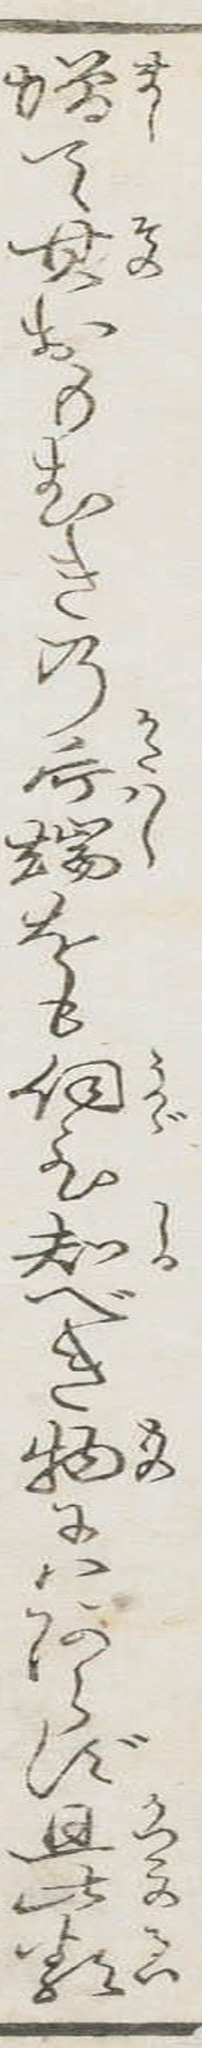増て其おもむきの片端をも伺ひ知べき物にはあらず且此類
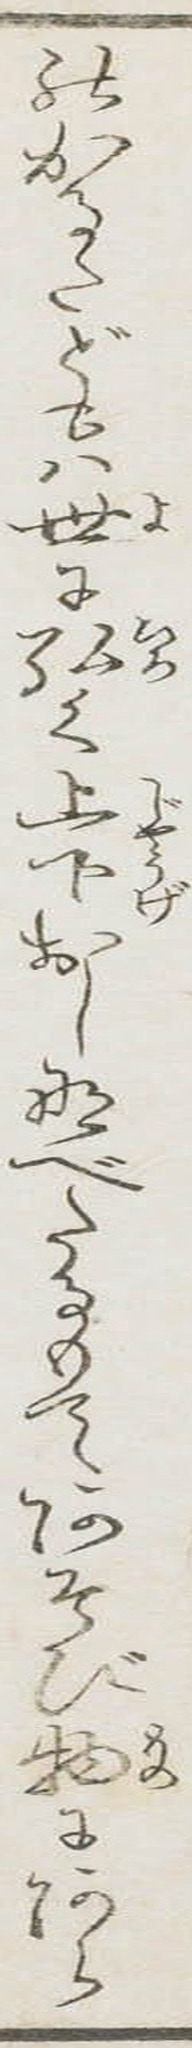のかるたどもは世に弘く上下おしなべたるもてあそび物にあら
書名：源氏百人一首
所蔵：東京学芸大学教育コンテンツアーカイブ
